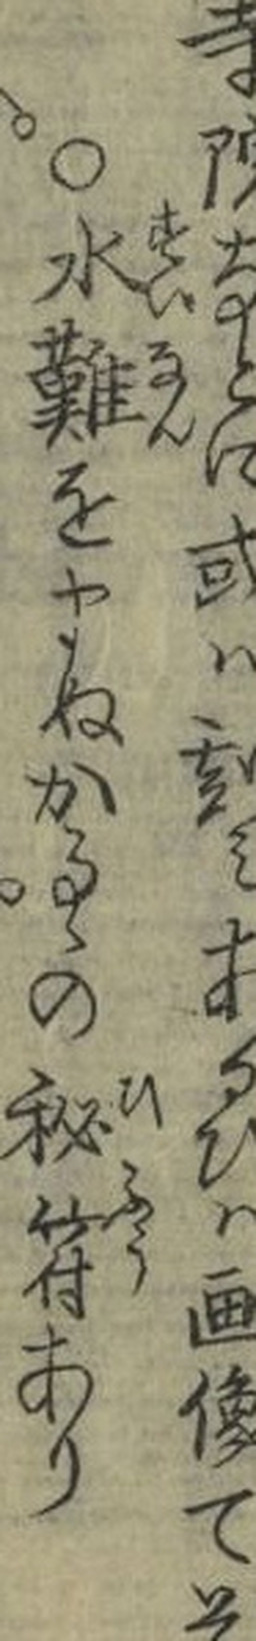○水難をまねかるゝの秘符あり
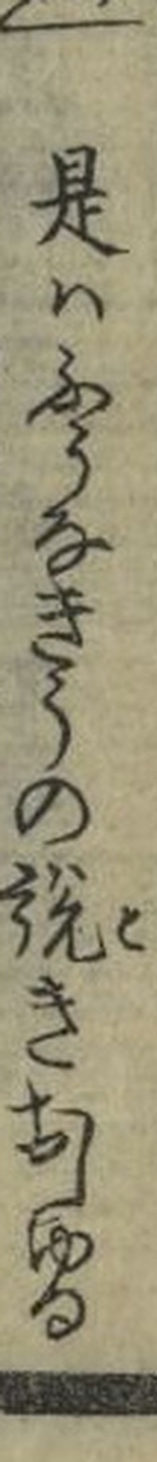是はふうなきうの説きおしゆる
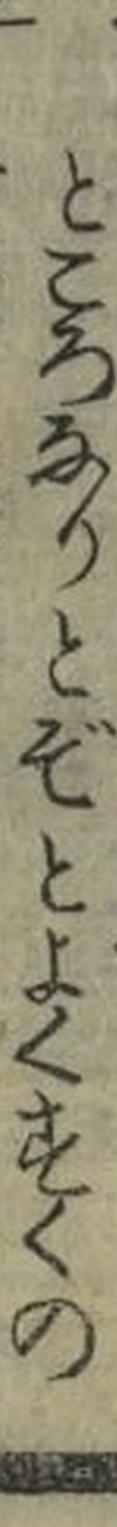ところなりとぞとよくすくの
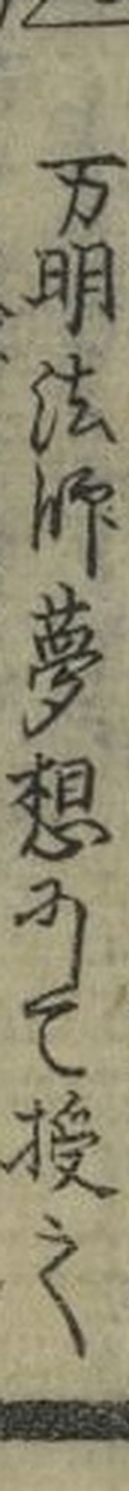万明法師夢想にて授く
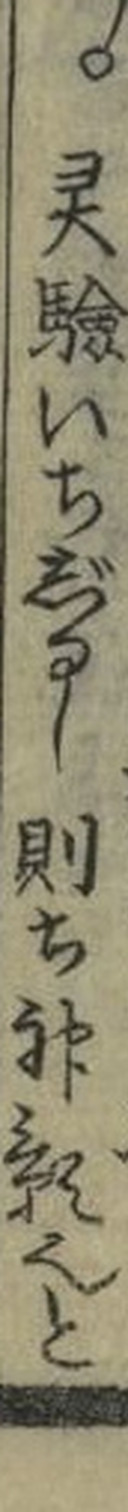霊験いちじるし則ち神影也と

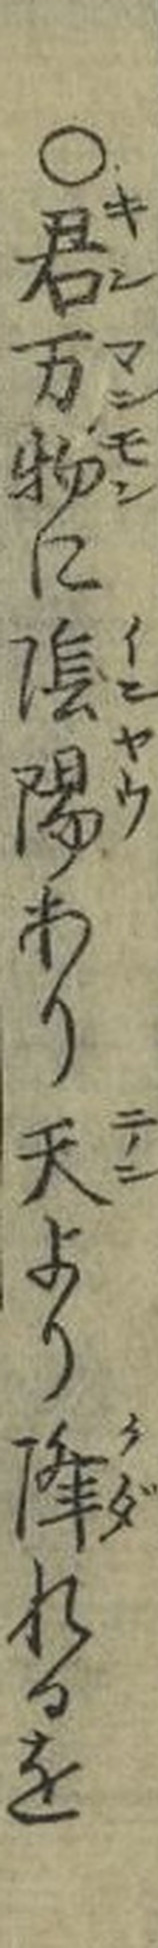○君万物に陰陽あり天より降れるを
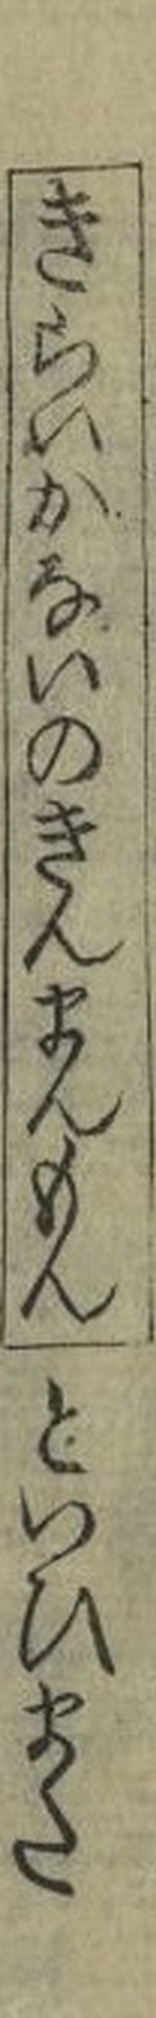「きらいかないのきんまんもん」といひまた
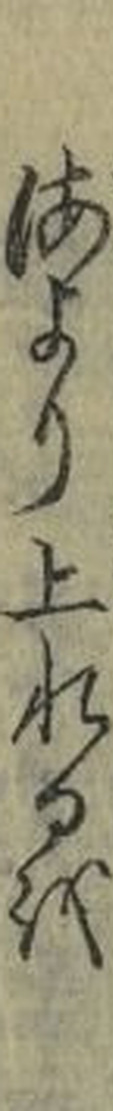海より上れるを
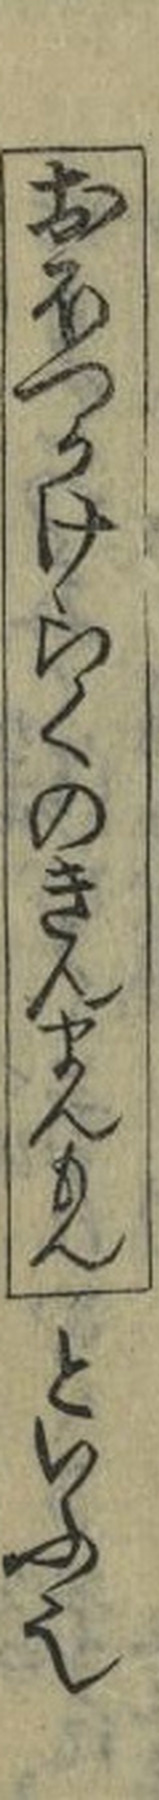「おほつかけらくのきんまんもん」といふ也
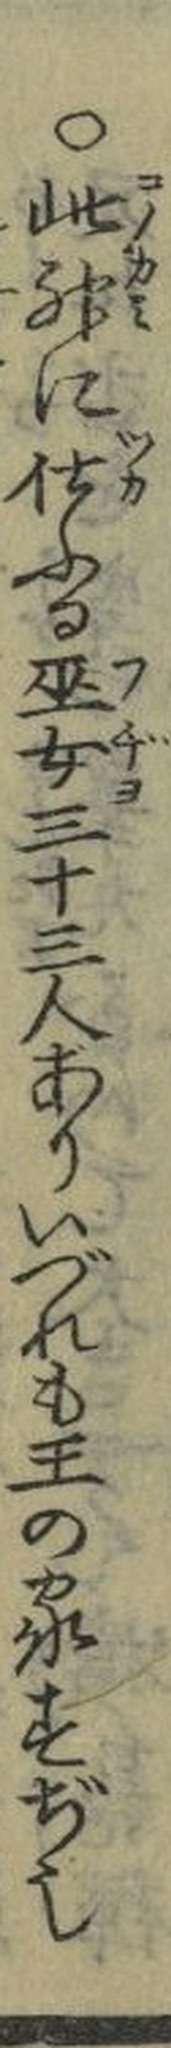○此神仕ふる巫女三十三人ありいづれも王の家すぢ也
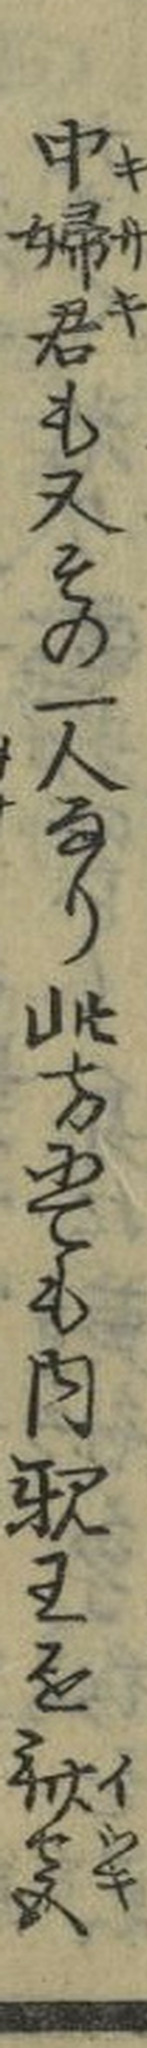中婦君も又その一人なり此方にても内親王を斎宮
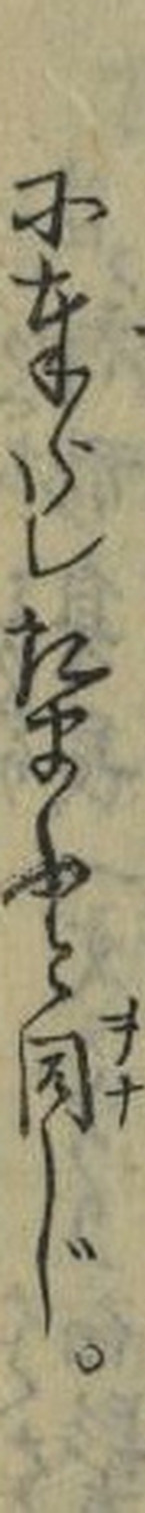に奉らしたまふと同じ。
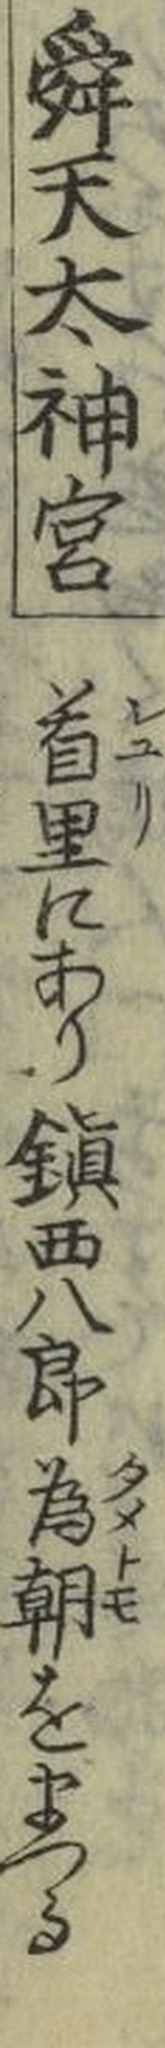「舜天大神宮」首里にあり。鎮西八郎為朝をまつる
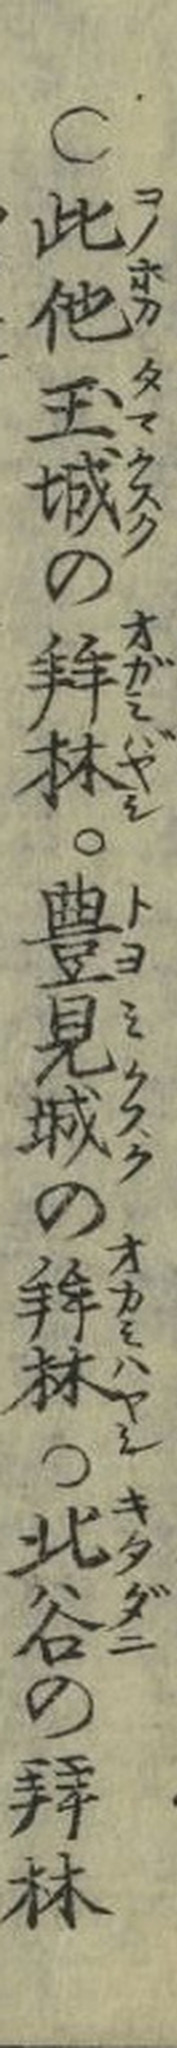○此他玉城の拝林○豊見城の拝林○北谷の拝林
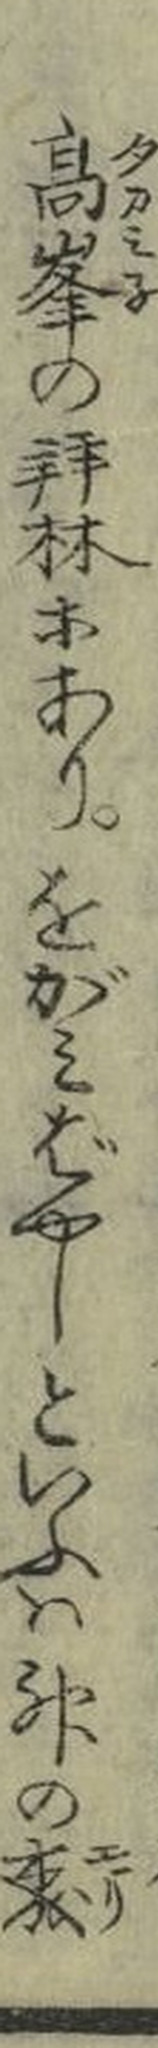高峯の拝林等あり。をがみばやしといふは神の森(モリ）
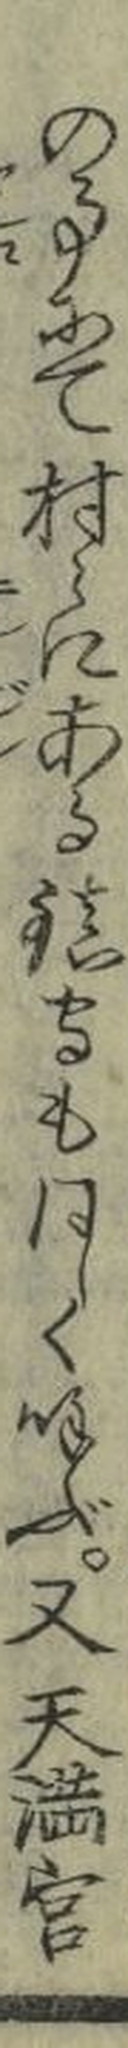の事にて村々にある鎮守も同しく呼ぶ。又天満宮
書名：琉球奇譚
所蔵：University of the Ryukyus Library
